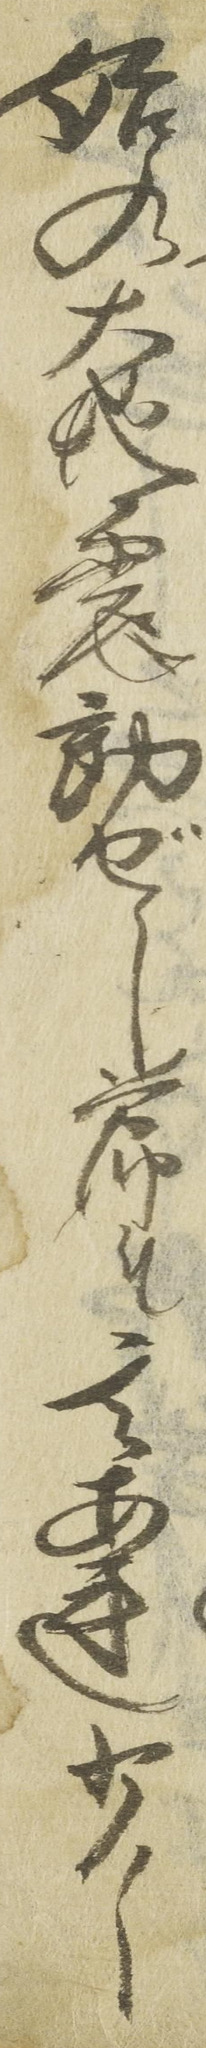始の大地震動ぜし節も其あれ少く
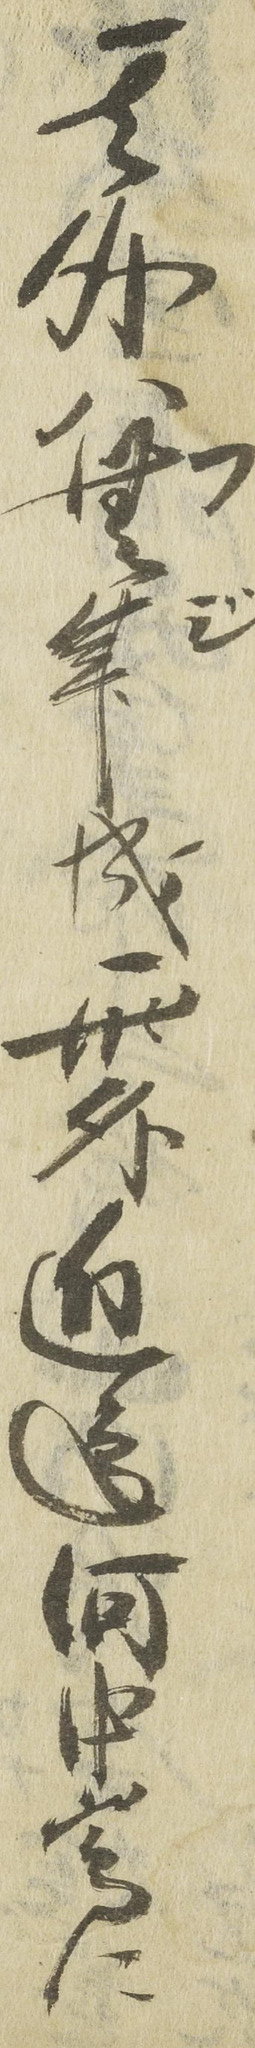其外無事成此外近辺河中嶌に
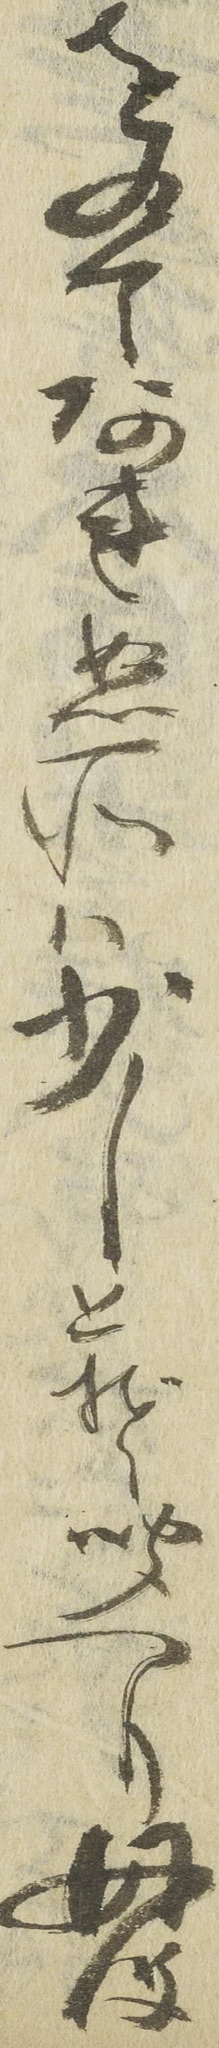をゐてあれぬ所は少しとぞ聞へり丹波
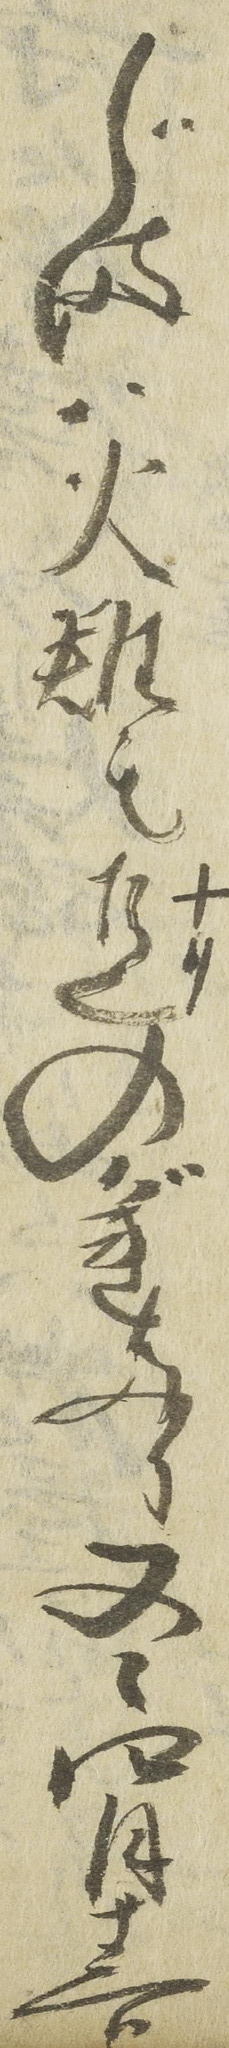じまは火難もなくのがれたり又々四月十三日
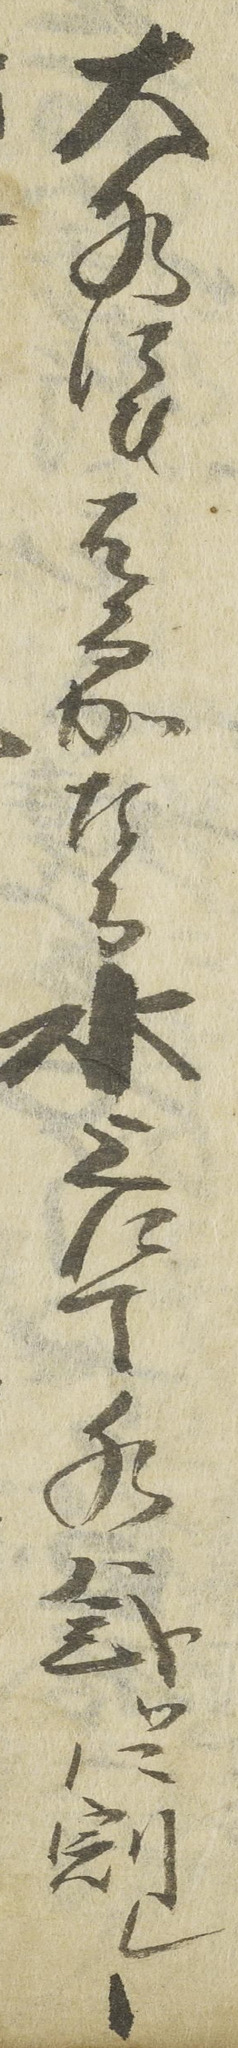大水にもはるかなる水上にて水弐ツに割レ
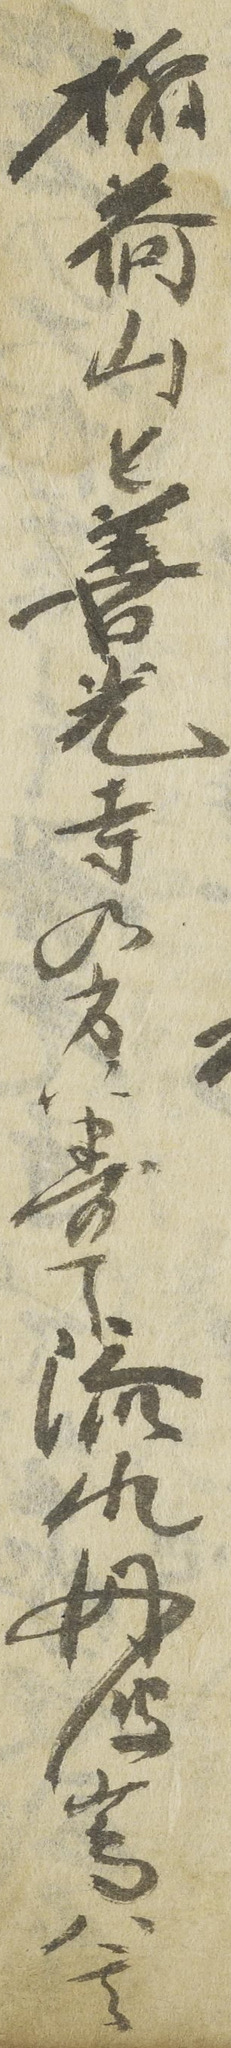稲荷山と善光寺の方ニ寄て流れ丹波嶌は其
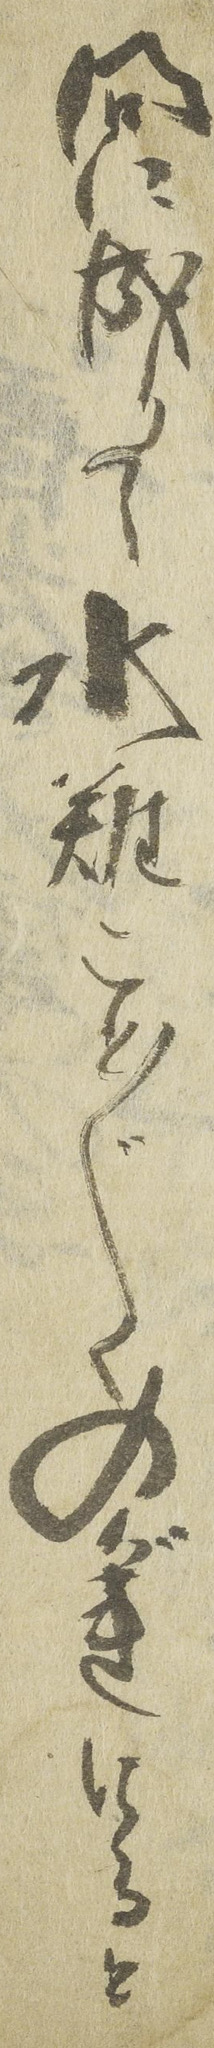間に成りて水難こと〴〵くのがれけるとなり

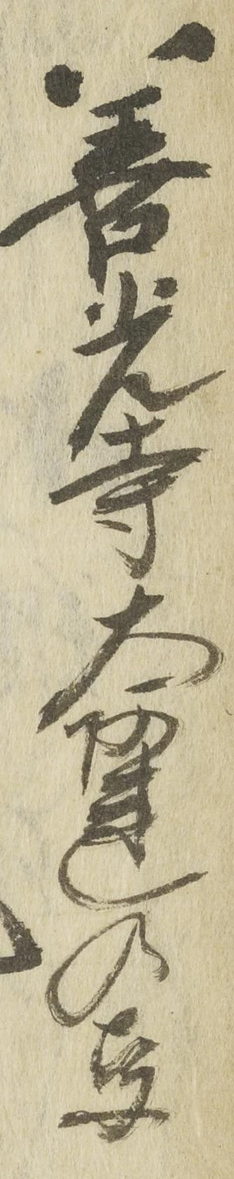善光寺大あれの事
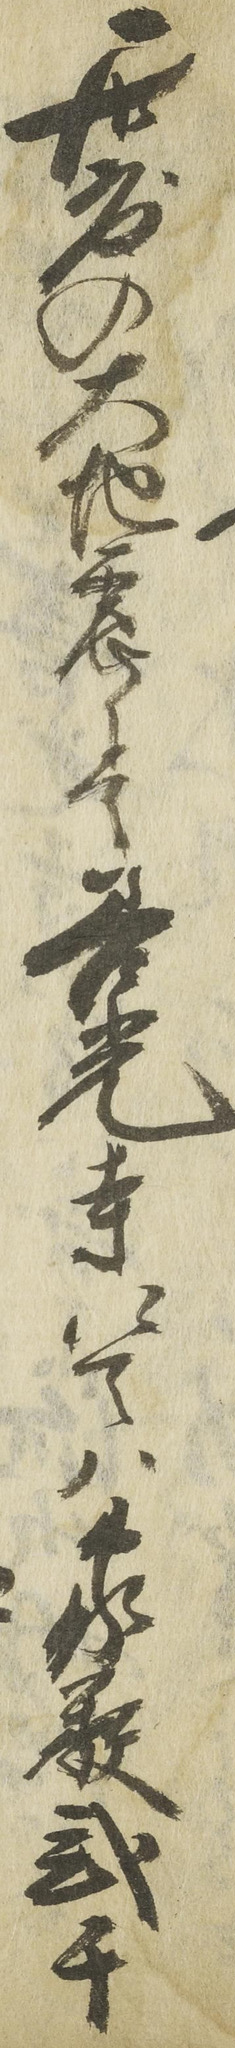此度の大地震にて善光寺にては家数弐千
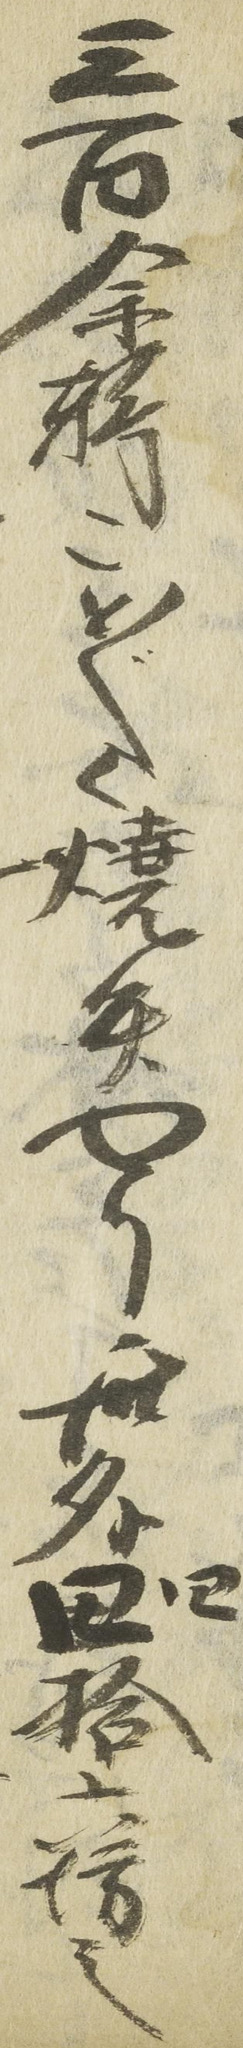三百余軒こと〴〵く焼失せり此外四拾六坊之
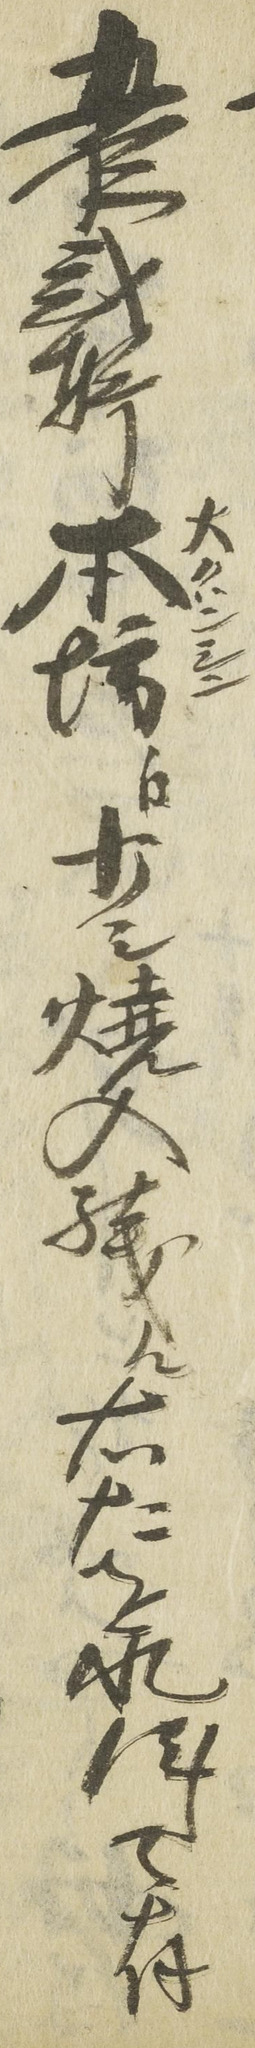五拾弐軒本坊江少し焼入残る右たをれ掛て有
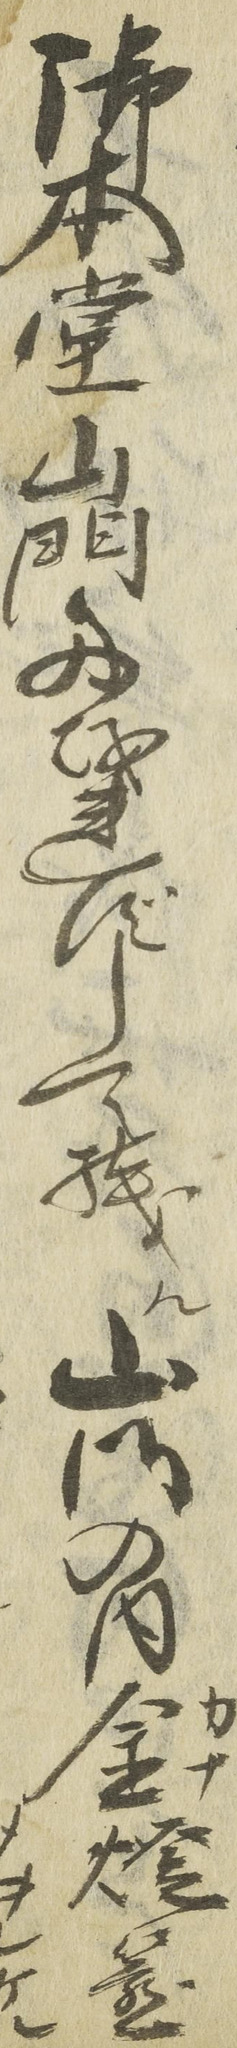御本堂山門たをれずして残る山門の内金燈籠
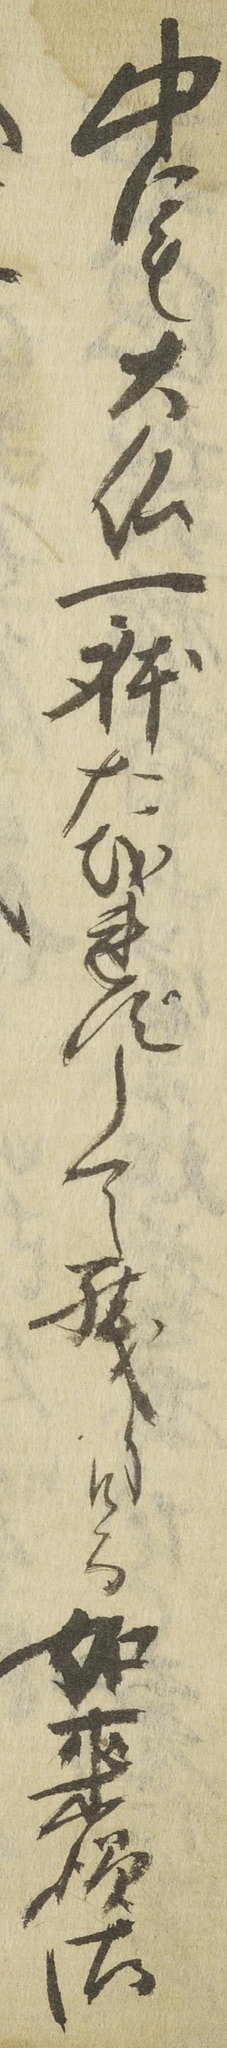中にも大仏一躰たをれずして残りける如来様御
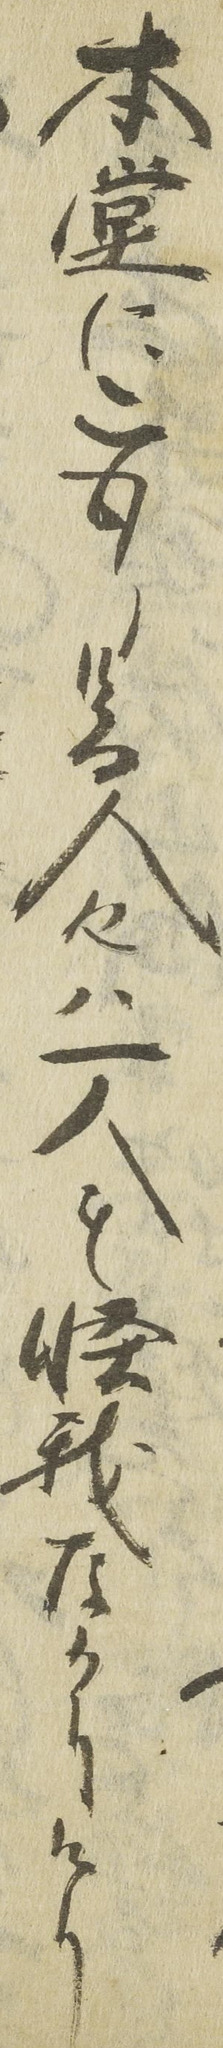本堂にこもりける人々は一人も怪我なかりけり
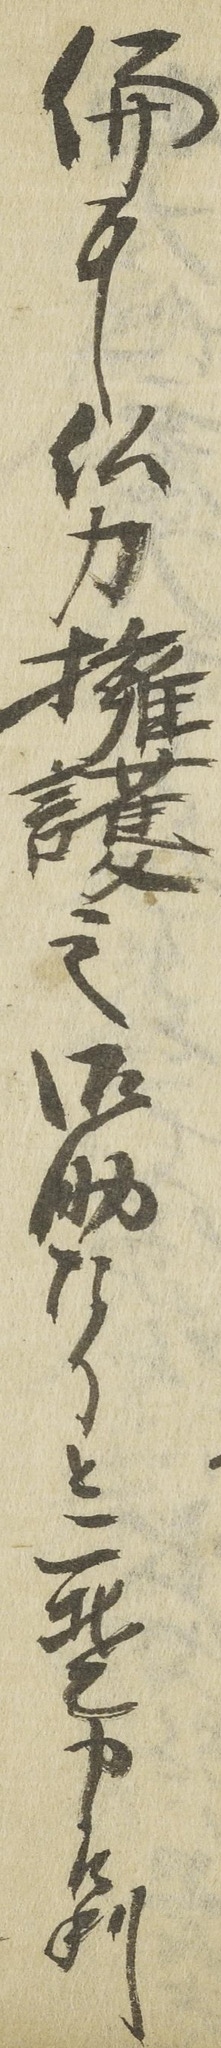偏に仏力擁護之御助なりとこそ申けり
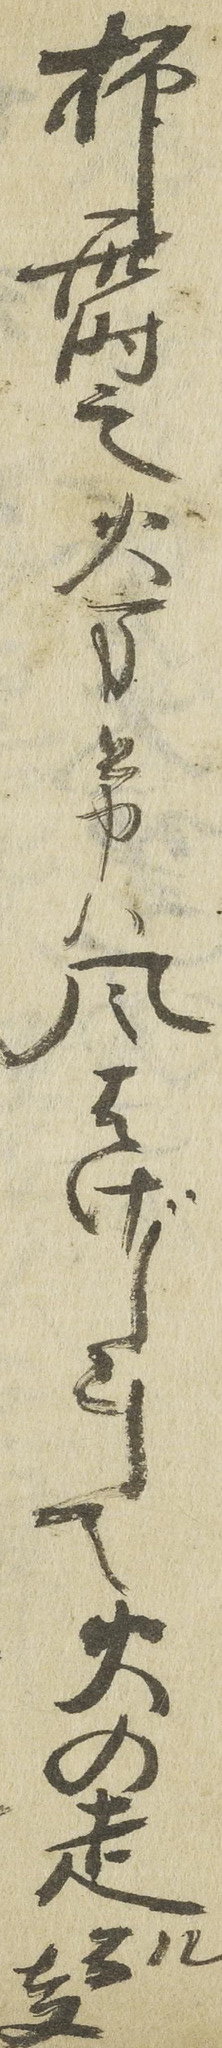抑此時之火事と申は風はげしくて火の走る事
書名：善光寺地震聞書
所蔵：東京大学地震研究所図書室 Earthquake Research Institute Library, The University of Tokyo, JAPAN
